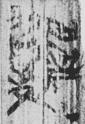○（喪）
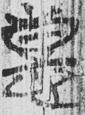○（喜）
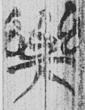樂
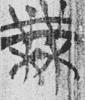無
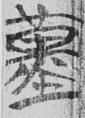堇（限）
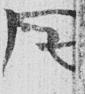厇（度）
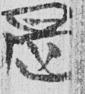是
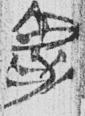{胃刀}（謂）
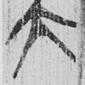大
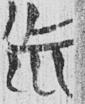○（荒）
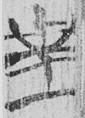皇
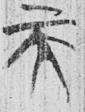天
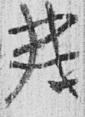弗
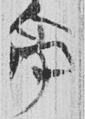京（諒）
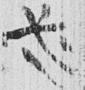必
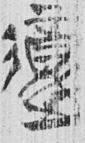○（復）
